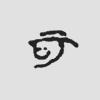可
